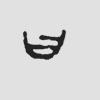曰
